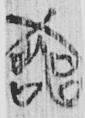器
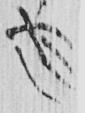必
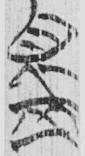○（蠲）
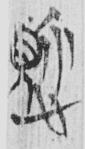○（潔）
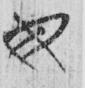母
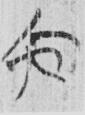内（入）
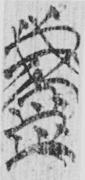錢（殘）
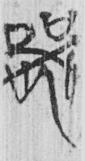器
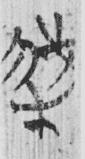○（犧）
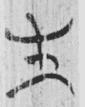生（牲）
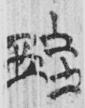珪
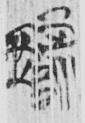璧
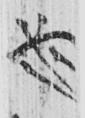必
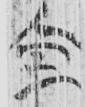全
